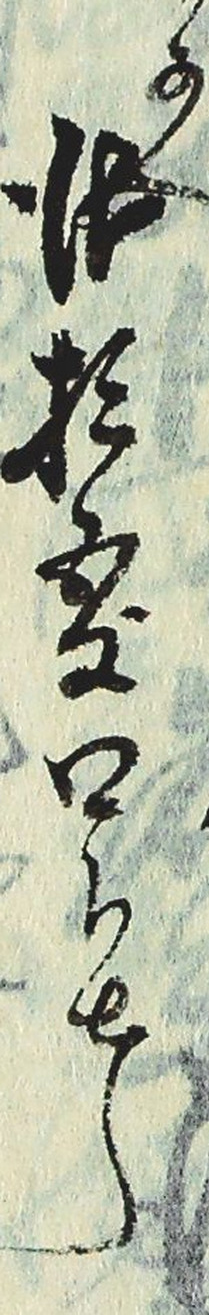代拾五匁四分七厘
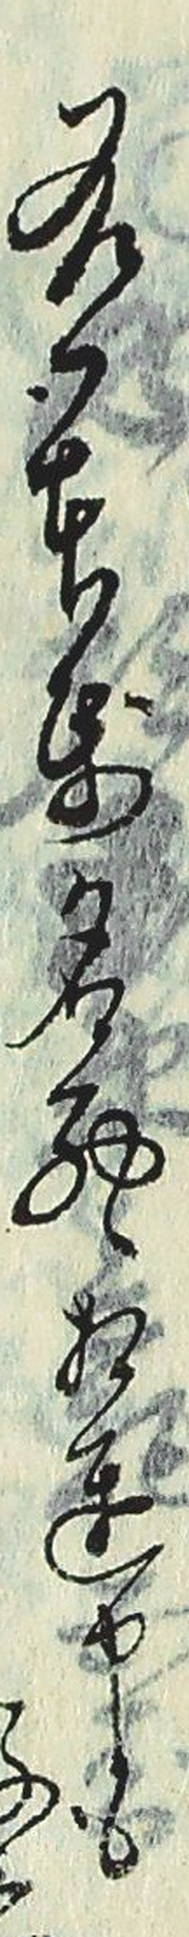右御本紙名西へ相達申候
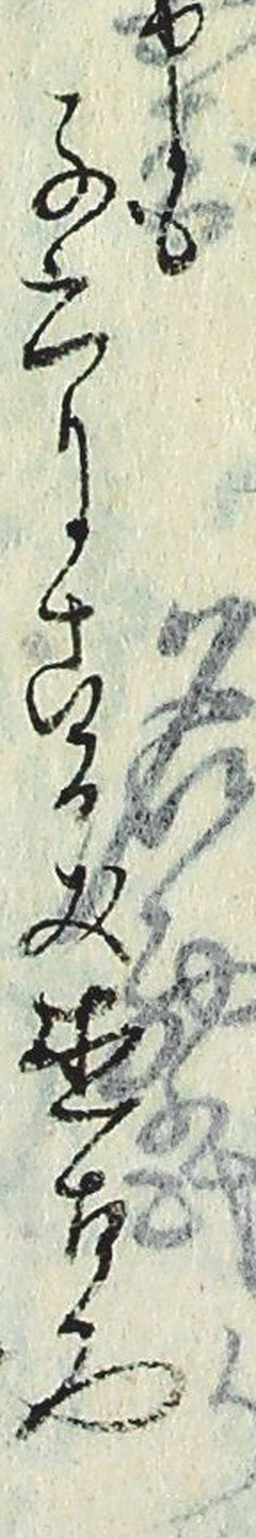子六月十四日使直左衛門
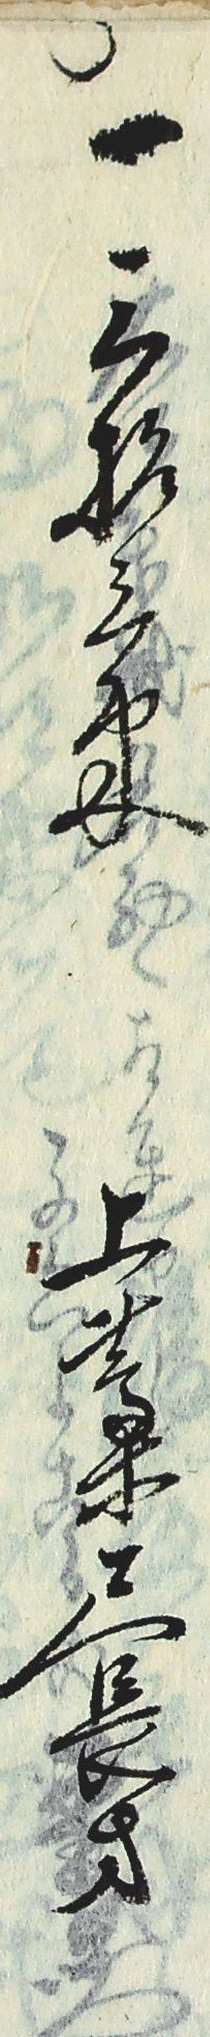一三拾三束上藁尺長方

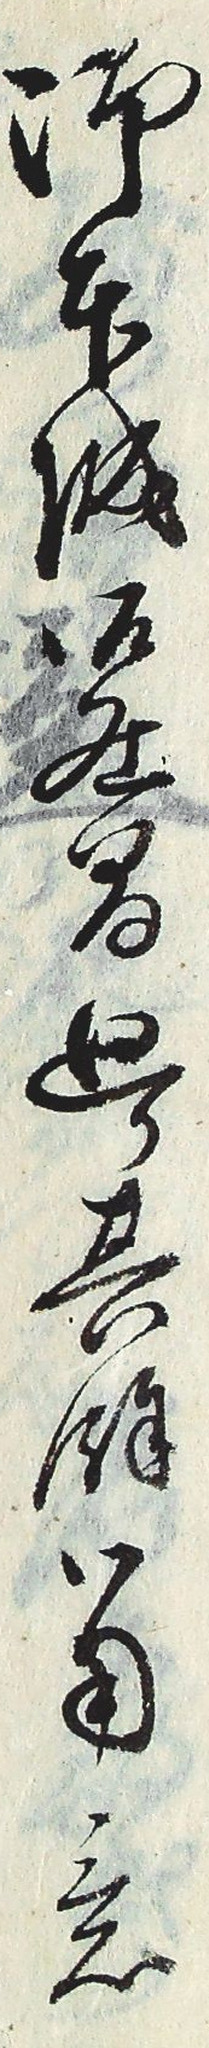御本城御居間廻り其余御用意
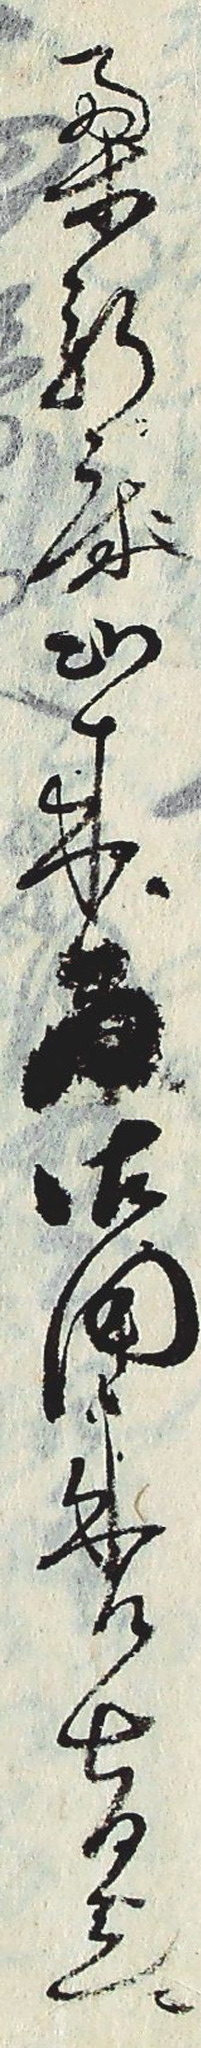畳新床出来為御用来る七日迄に
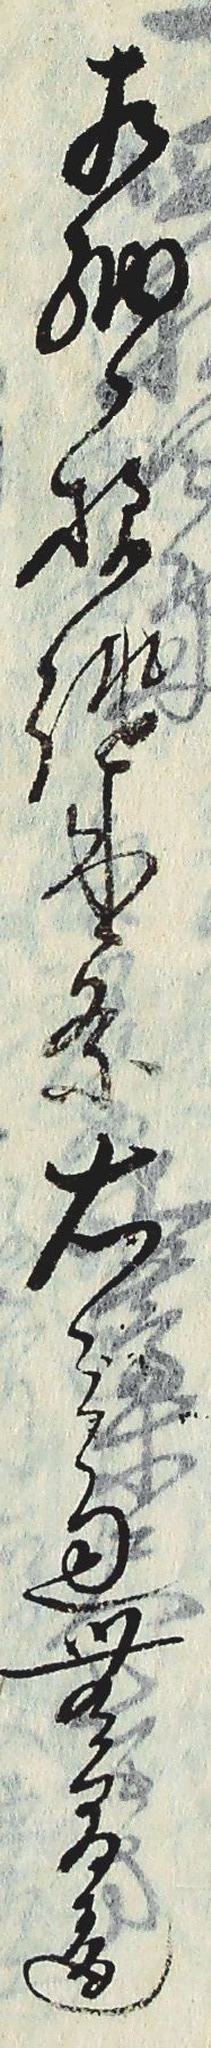相納候様誂来候条右之通無間違
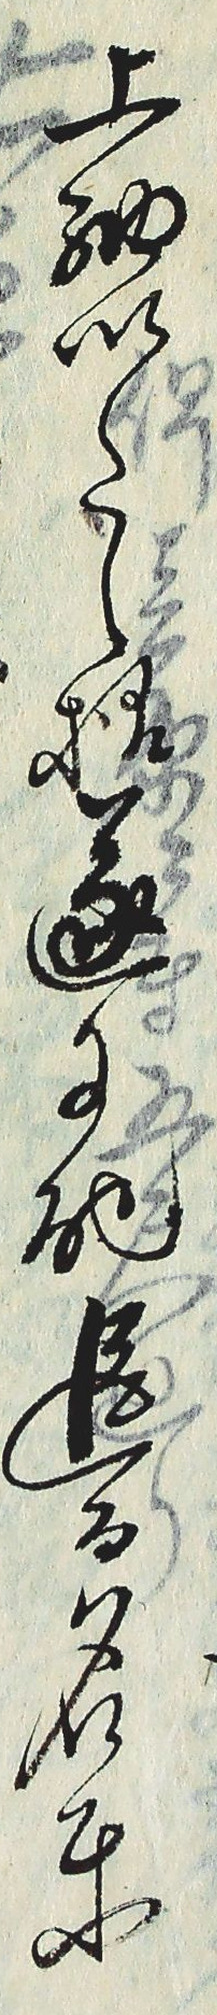上納いたし候様遂手配追て名東
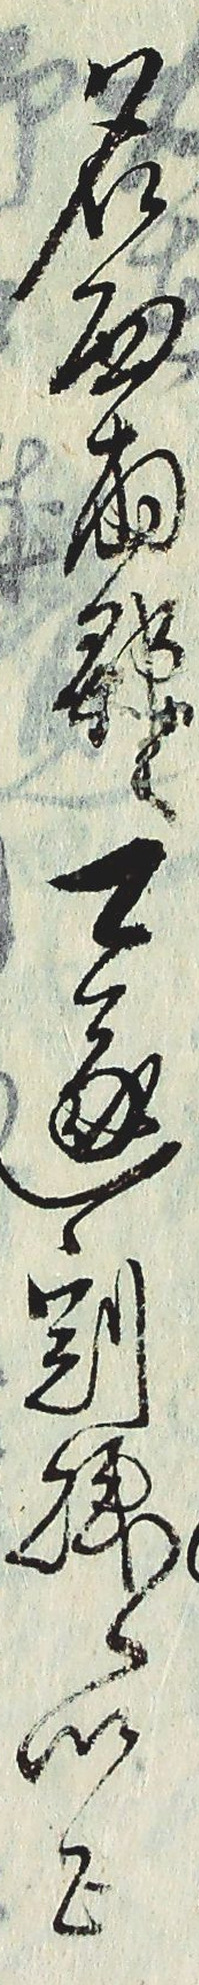名西両郡へ可遂割賦候以上
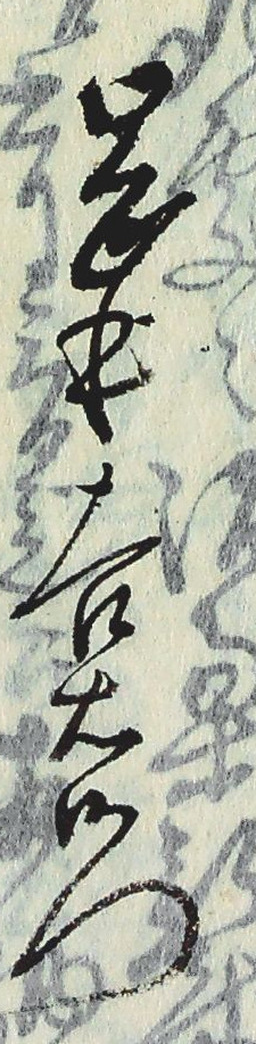岡本吉右衛門
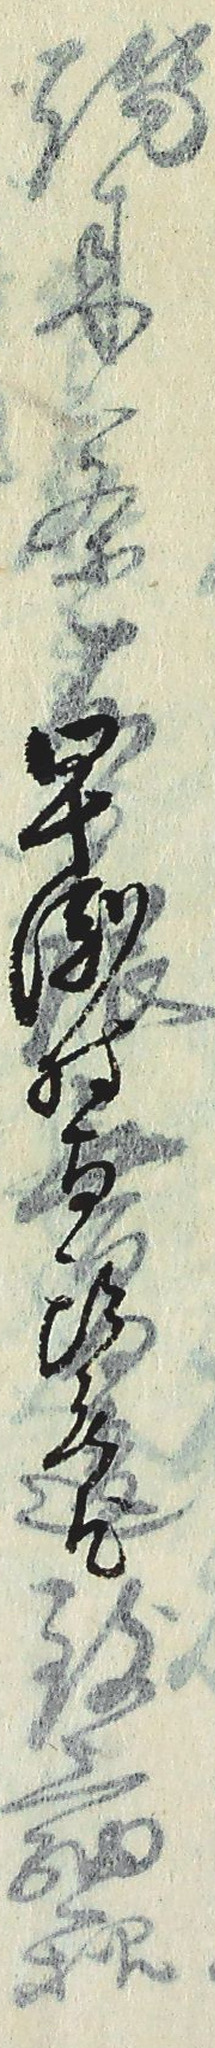早淵村与頭庄屋
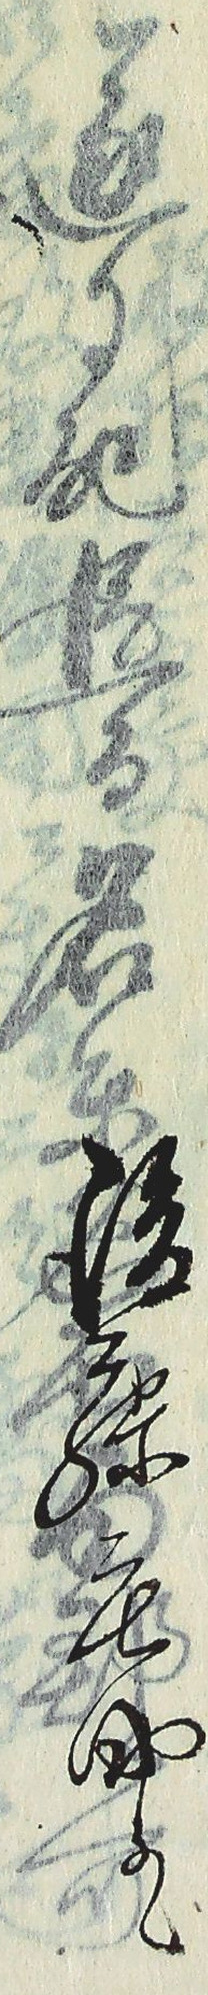後藤庄助方へ
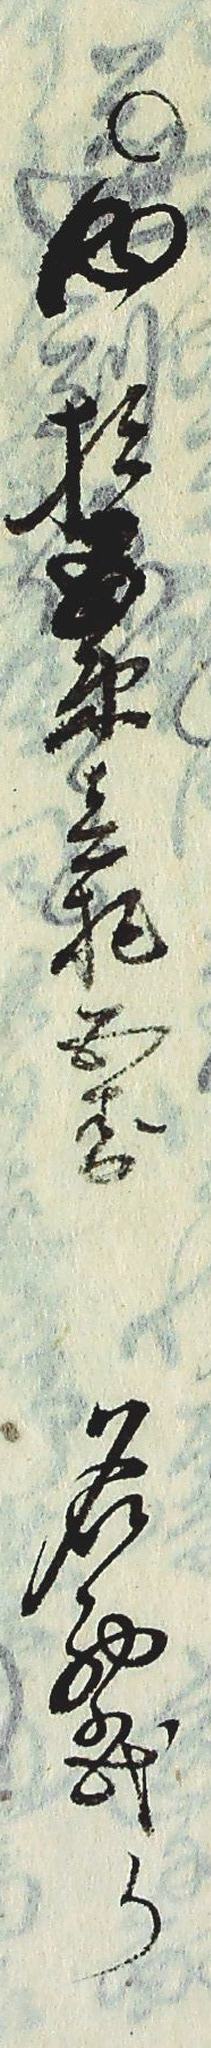内拾五束壱把五歩名西当り
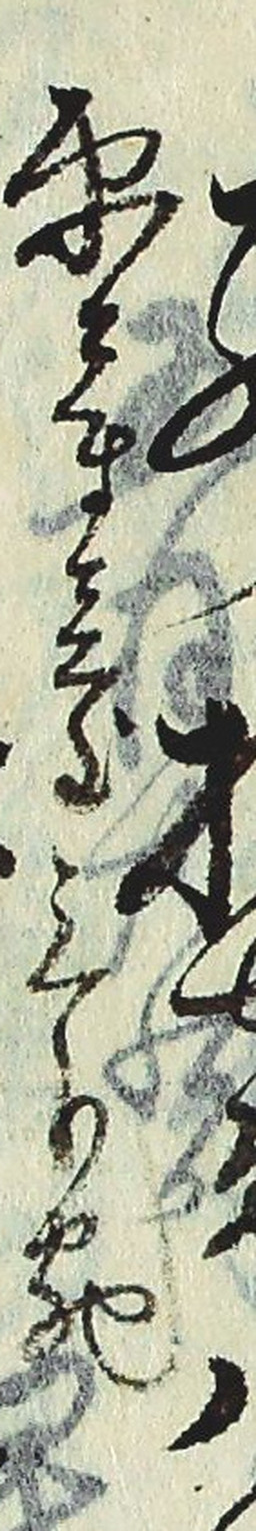束に付壱匁三分宛
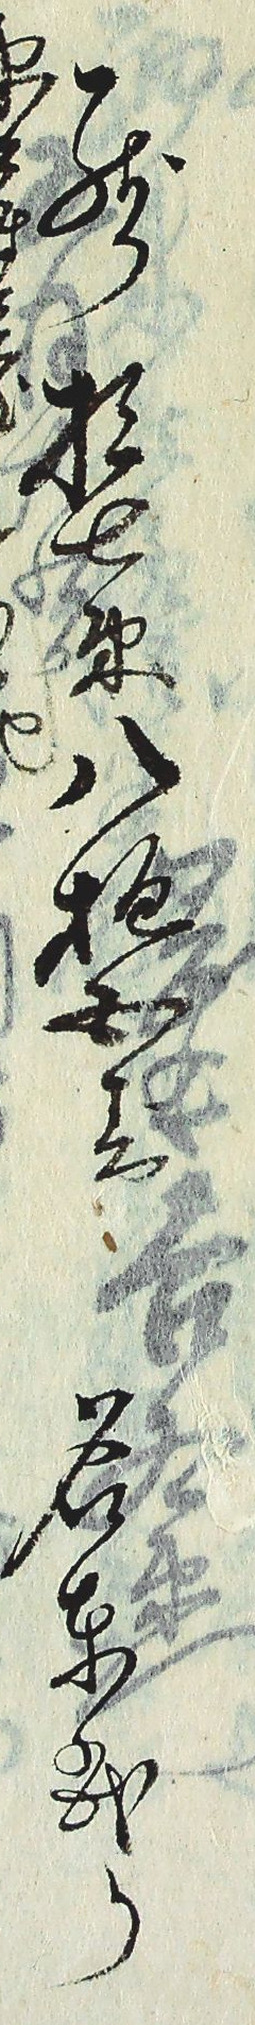残り拾七束八把五歩名東当り
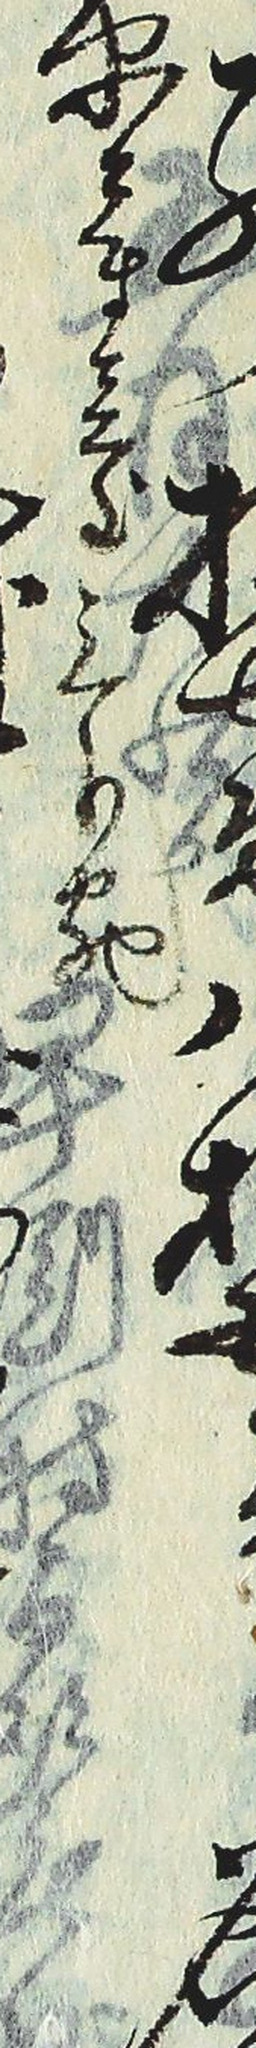束に付壱匁三分宛
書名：名東郡中諸割賦元帳
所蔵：鳴門教育大学 Naruto University of Education
